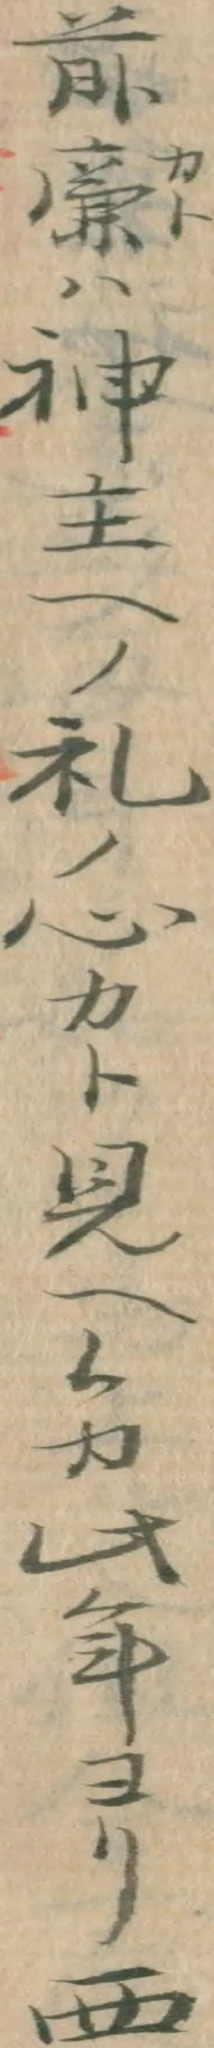前廉ハ神主ヘノ礼ノ心カト見ヘ候カ此年ヨリ西
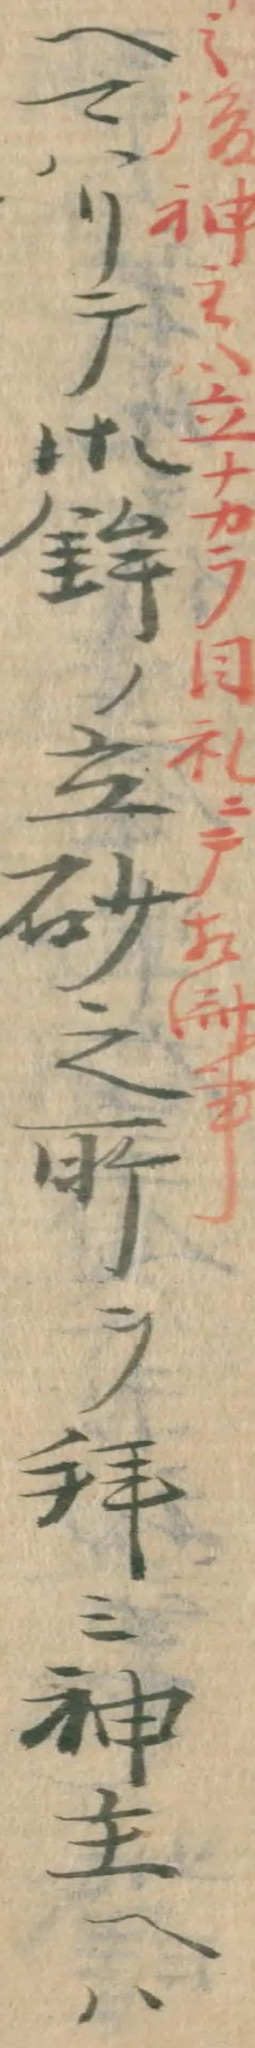ヘマハリテ御鉾ノ立砂之所ヲ拝ミ神主ヘハ
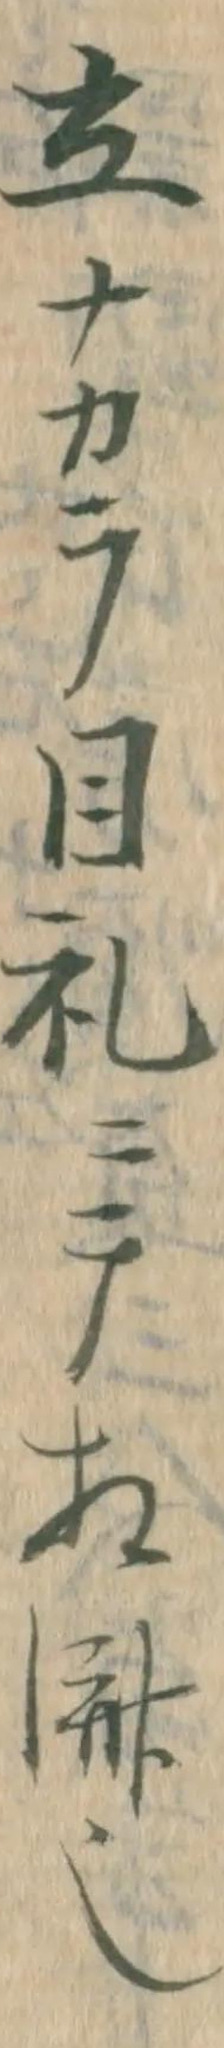立ナカラ目礼ニテ相済也
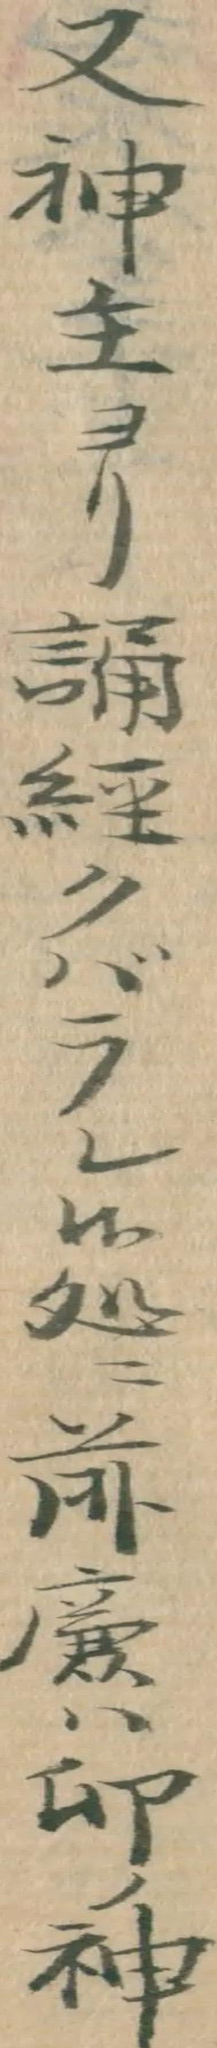又神主ヨリ誦経クバラレ候処ニ前廉ハ印ノ神
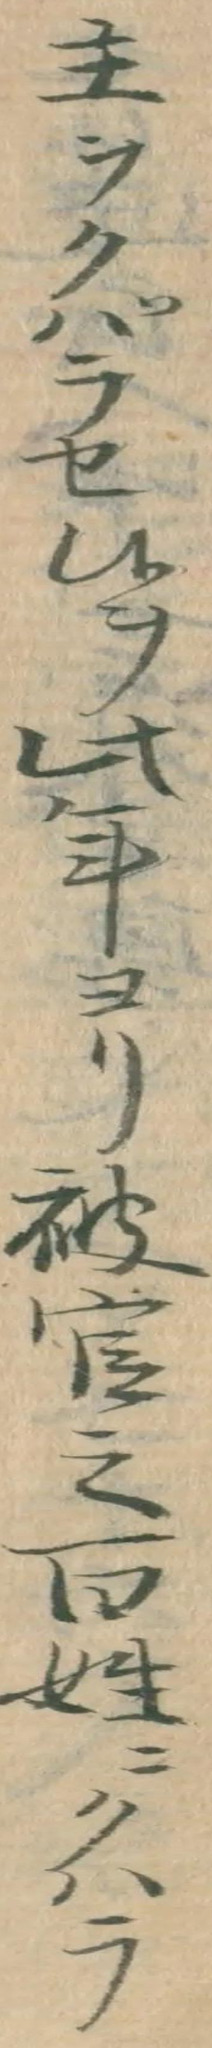主ヲクバラセ候ヲ此年ヨリ被官之百姓ニクハラ

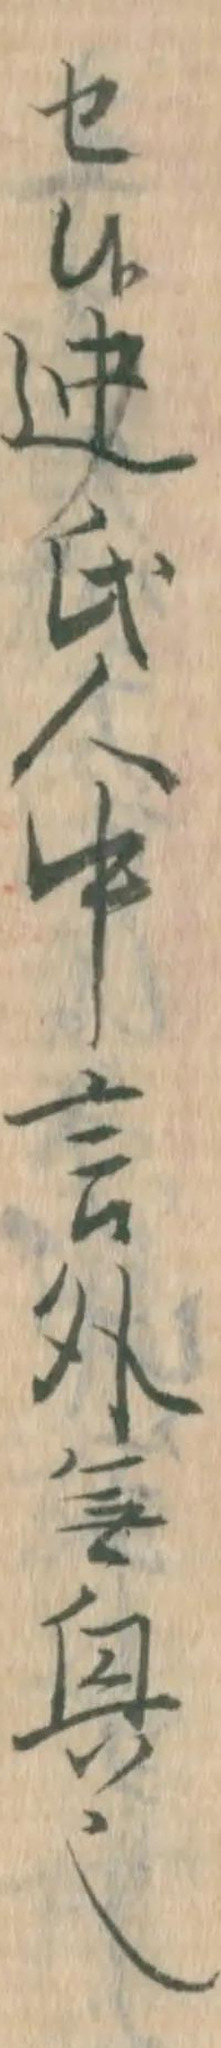セ候迚氏人中言外無輿也
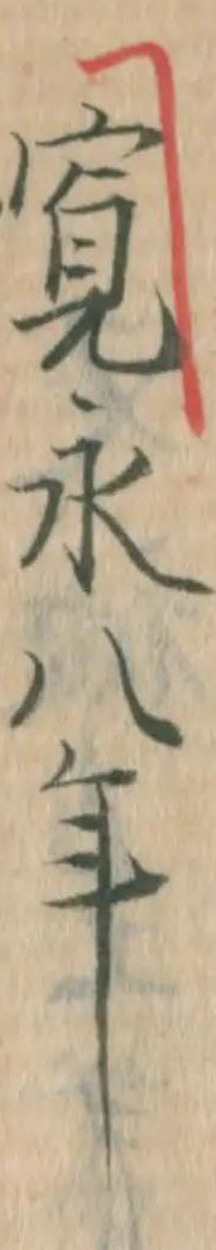寛永八年
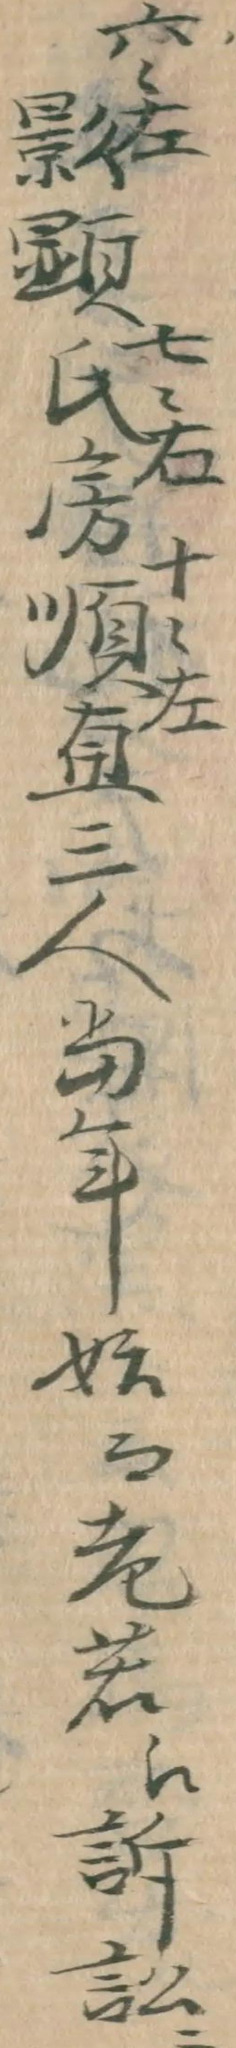影顕氏房順直三人当年始而老若江訴訟ニ
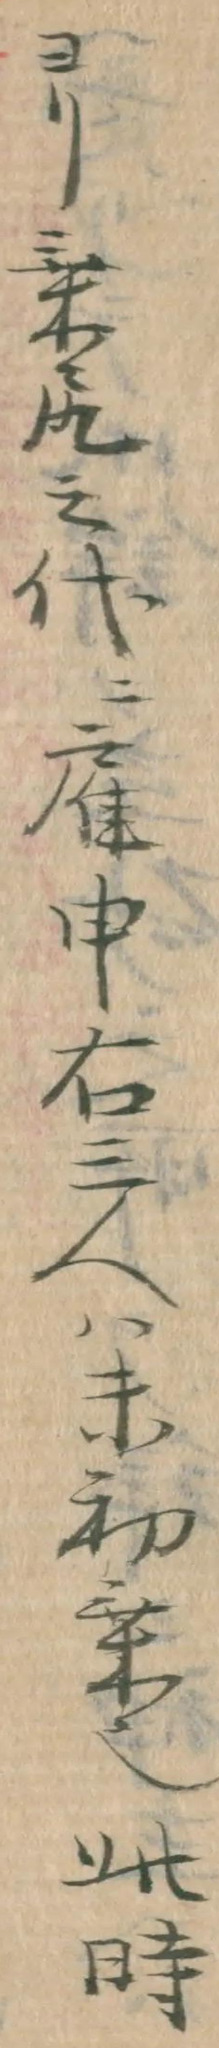ヨリ乗尻之代ニ雇申右三人ハ未初乗也此時
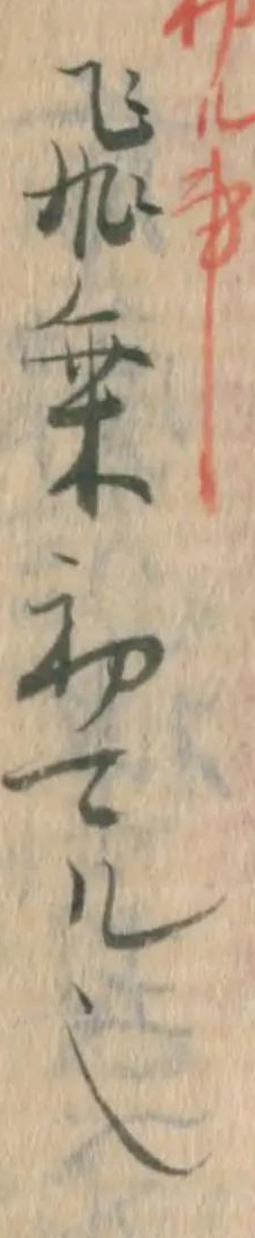飛乗初マル也
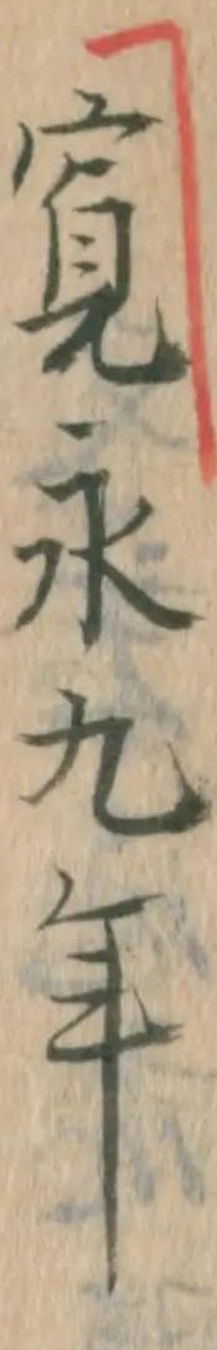寛永九年
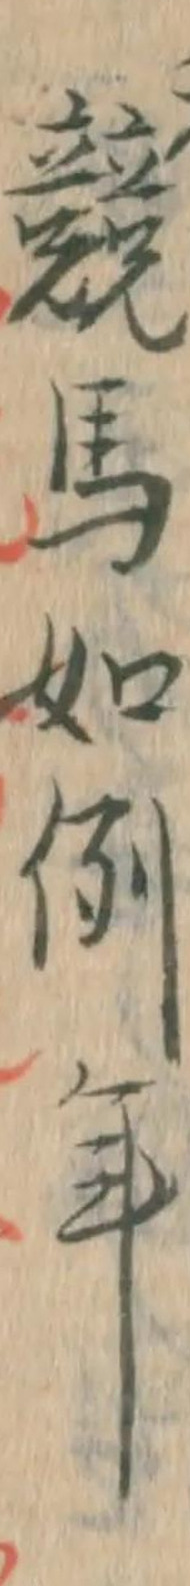競馬如例年
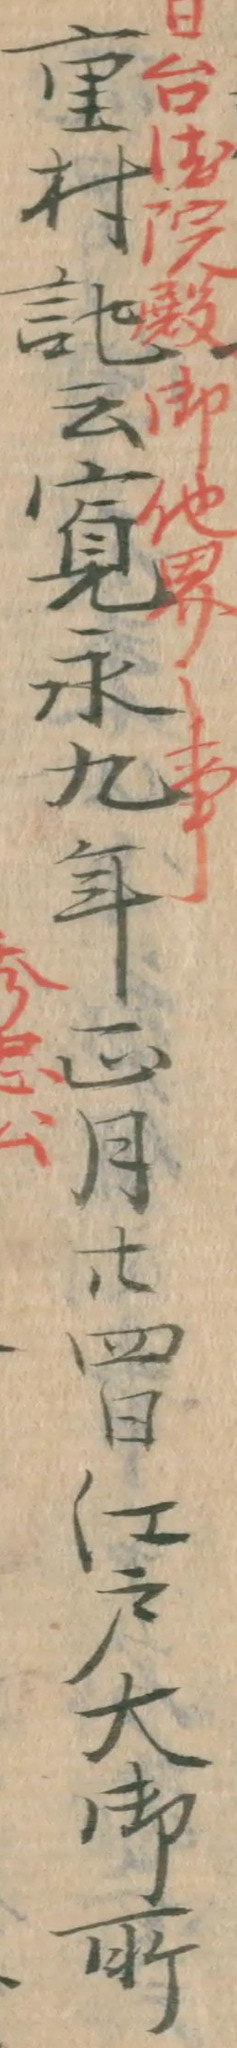重村記云寛永九年正月廿四日江戸大御所
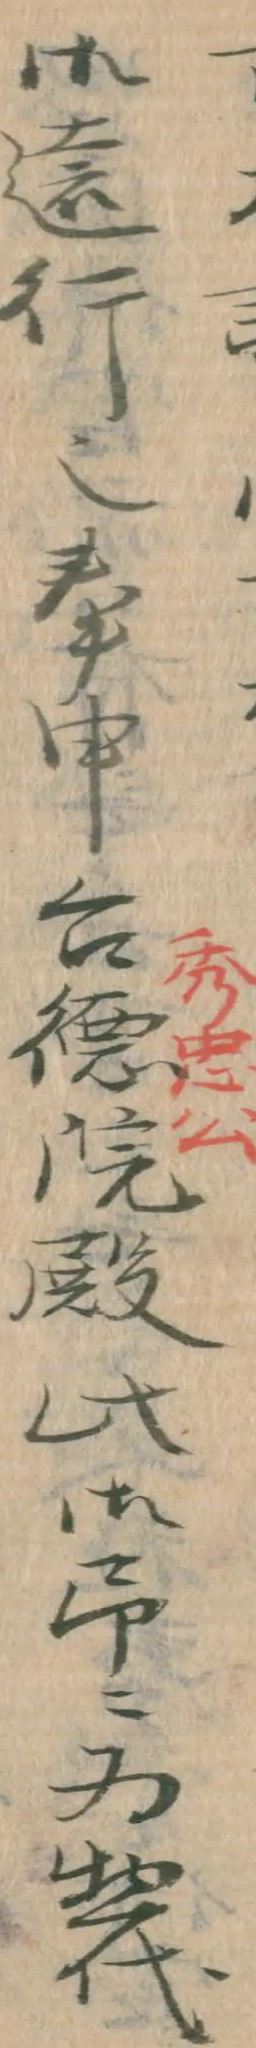御遠行也奉申台徳院殿此御弔ニ為惣代
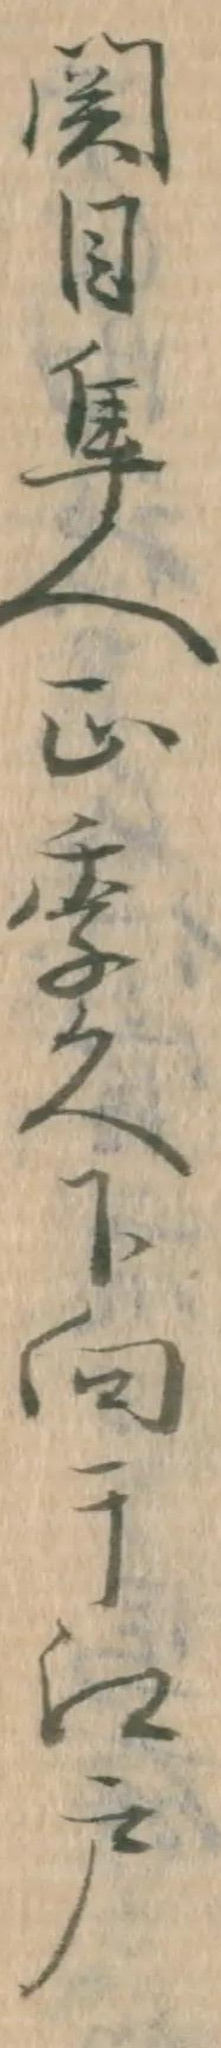関目隼人正季久下向干江戸
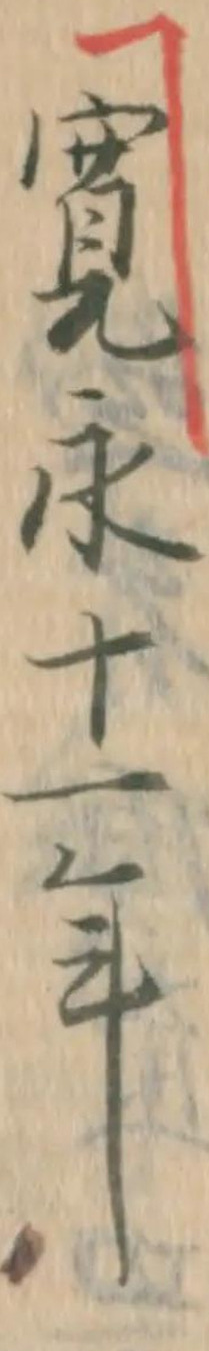寛永十一年
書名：賀茂社記録. 第10冊
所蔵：国立国会図書館 National Diet Library, JAPAN
